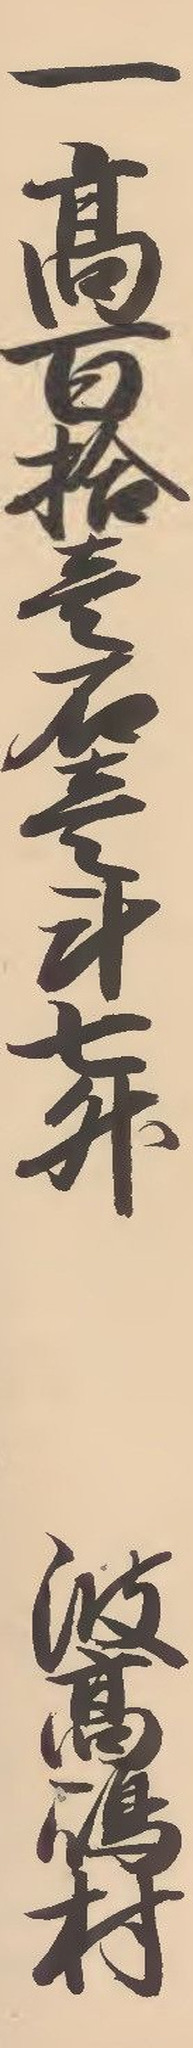一高百拾壱石壱斗七升波高島村
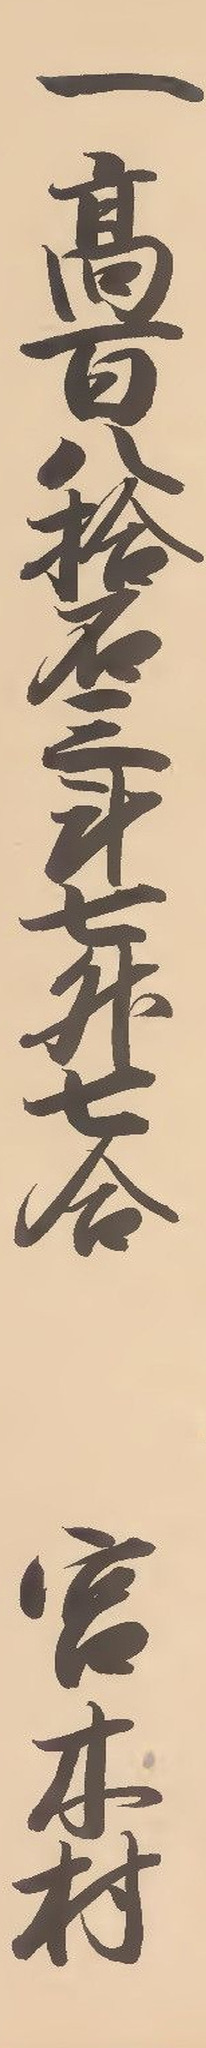一高百八拾石三斗七升七合宮木村
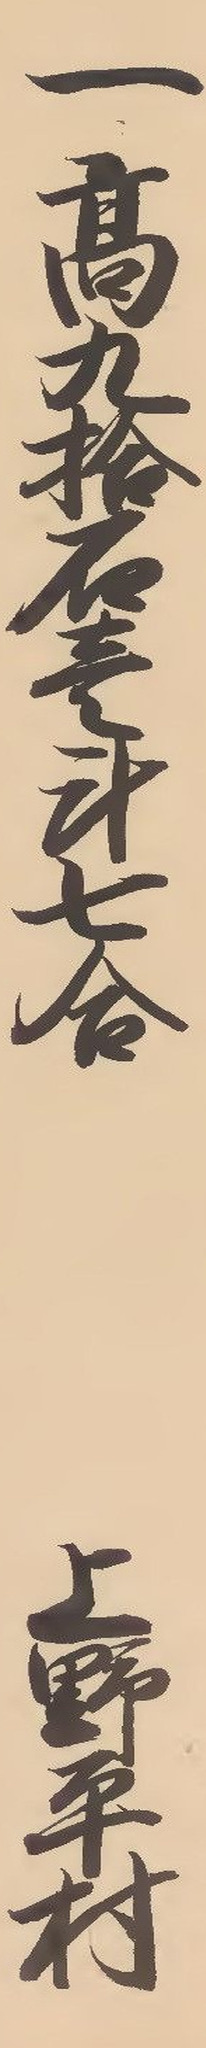一高九拾石壱斗七合上野平村
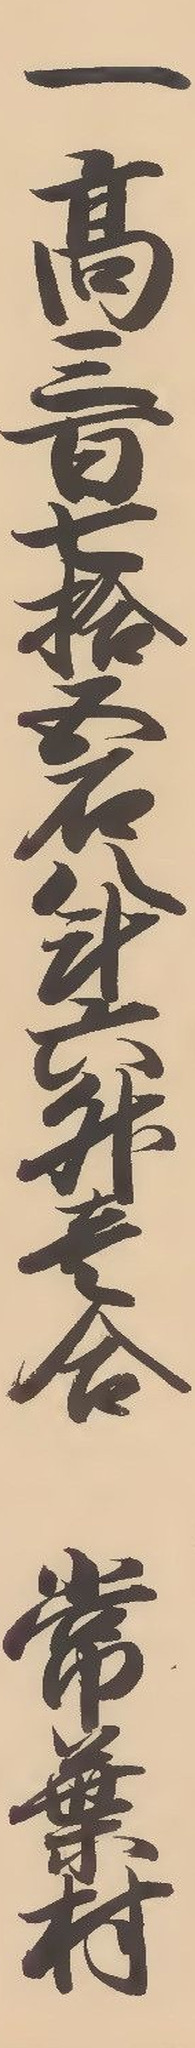一高三百七拾五石八斗六升壱合常葉村
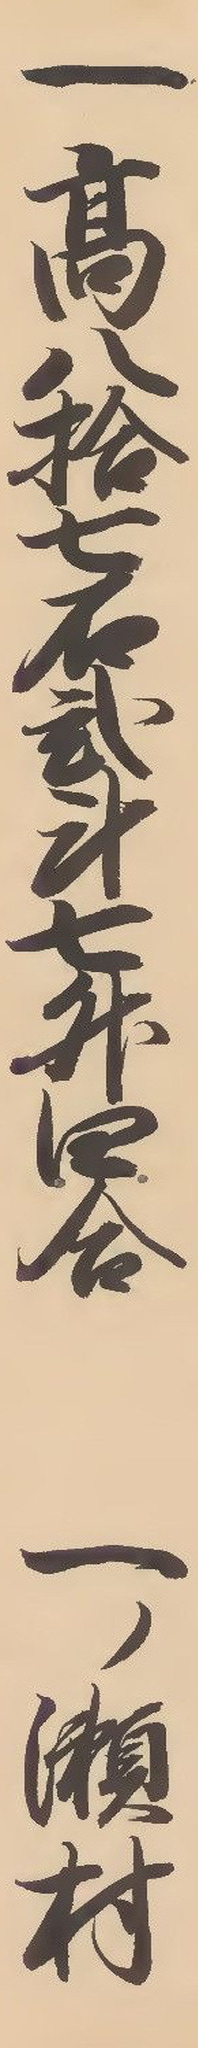一高八拾七石弐斗七升四合一ノ瀬村

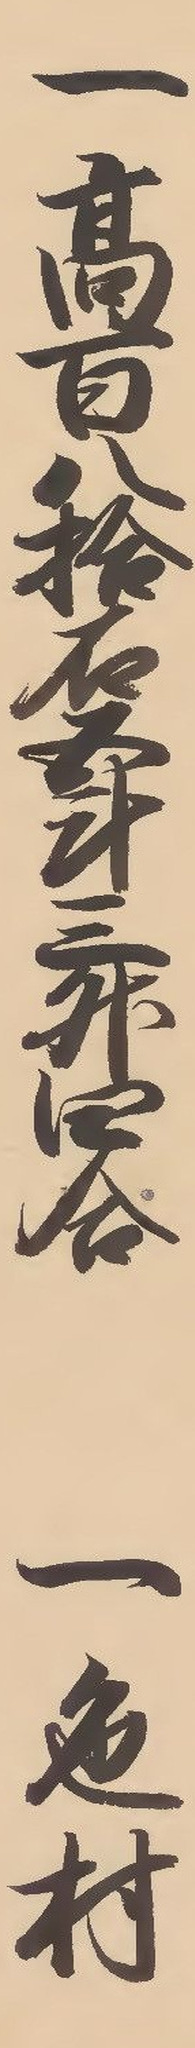一高百八拾石五斗三升四合一色村
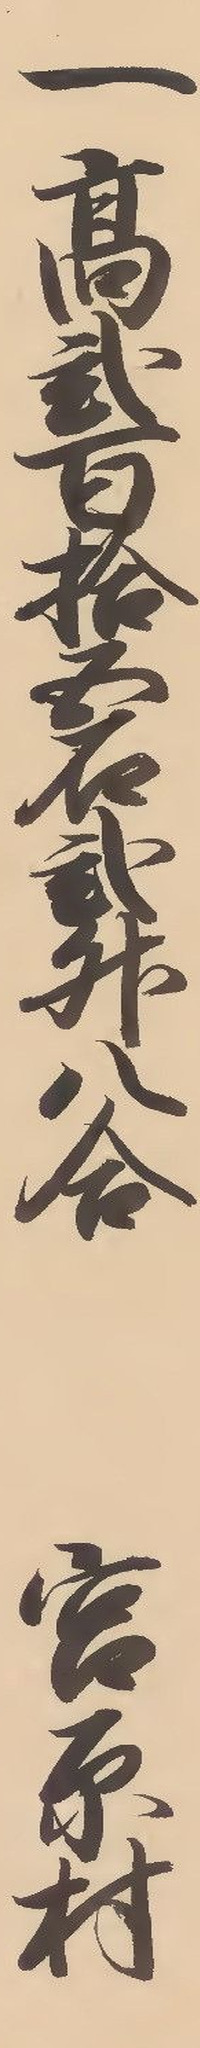一高弐百拾五石弐升八合宮原村
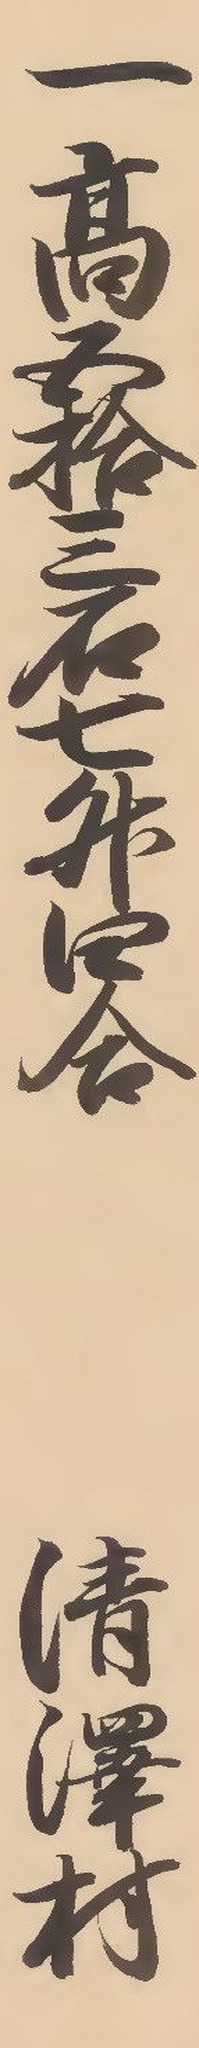一高五拾三石七升四合清沢村
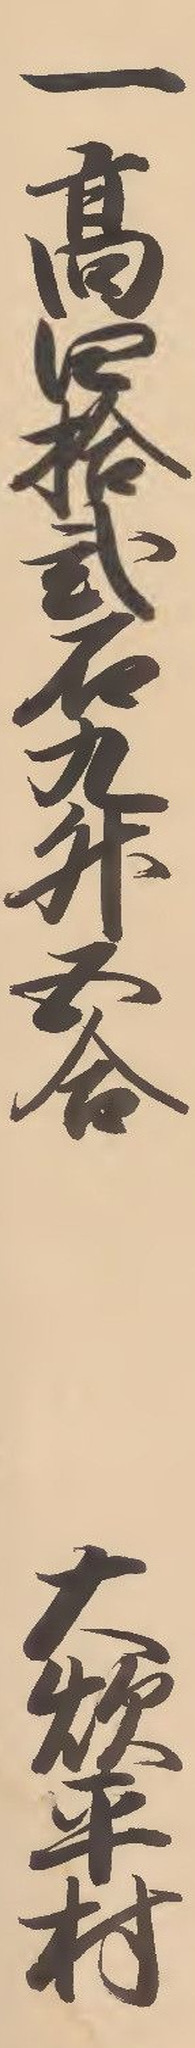一高四拾弐石九升五合大炊平村
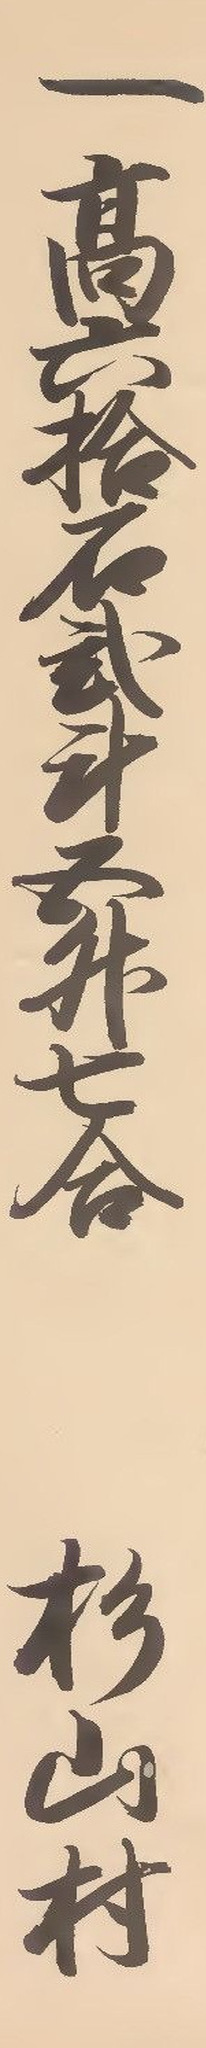一高六拾石弐斗五升七合杉山村
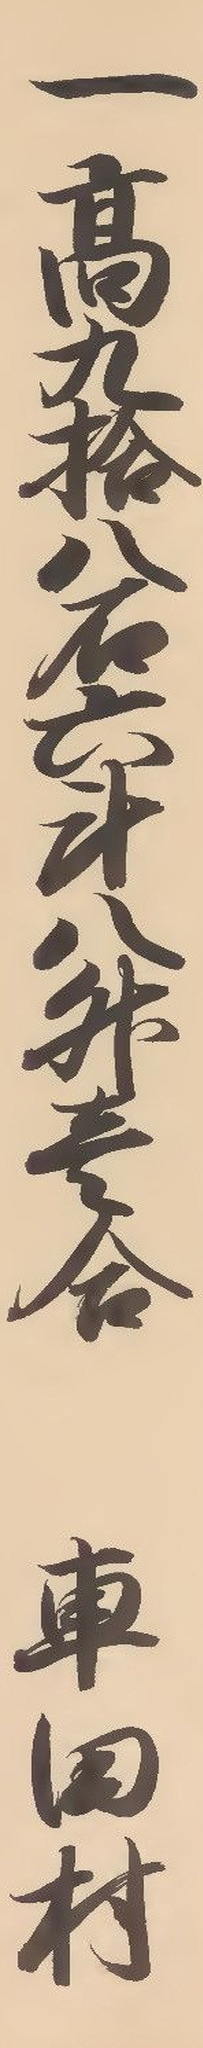一高九拾八石六斗八升壱合車田村
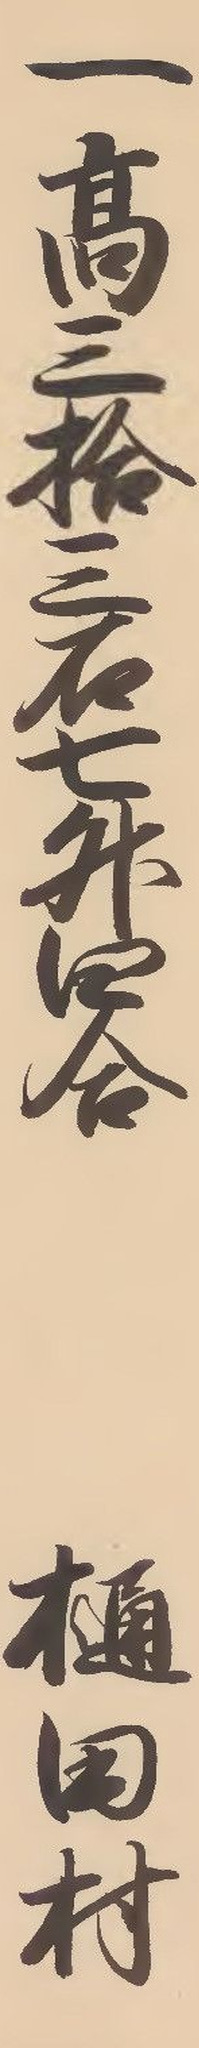一高三拾三石七升四合樋田村
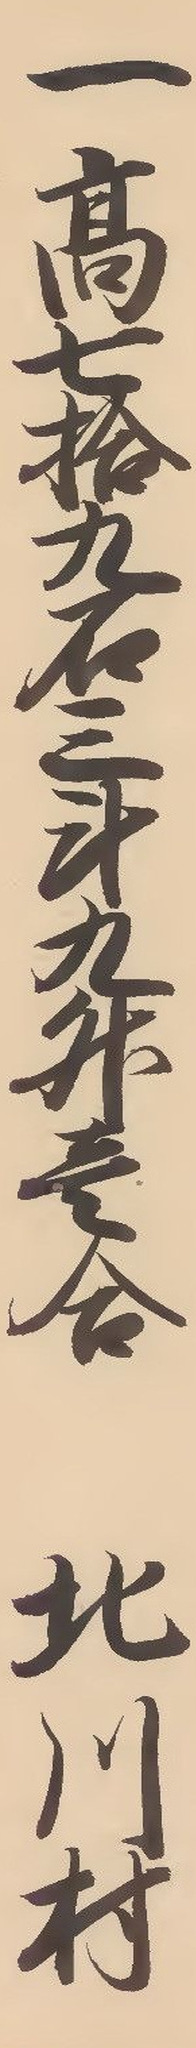一高七拾九石三斗九升壱合北川村

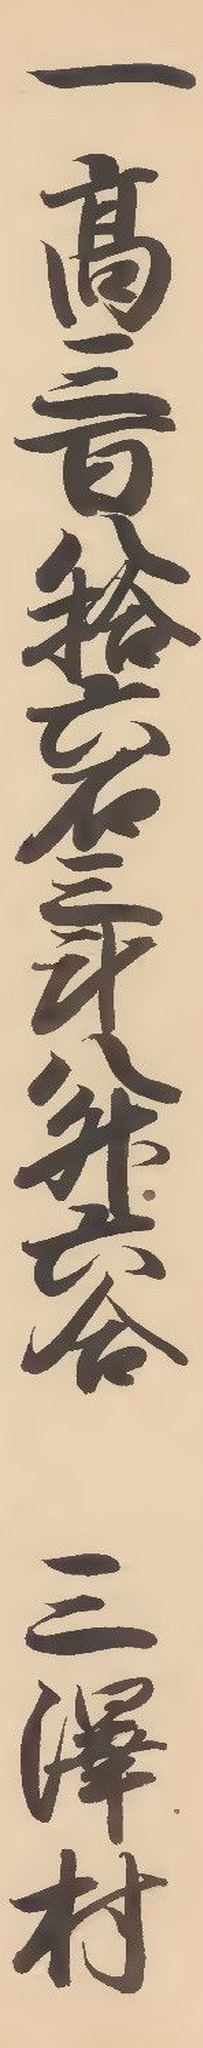一高三百八拾六石三斗八升六合三沢村
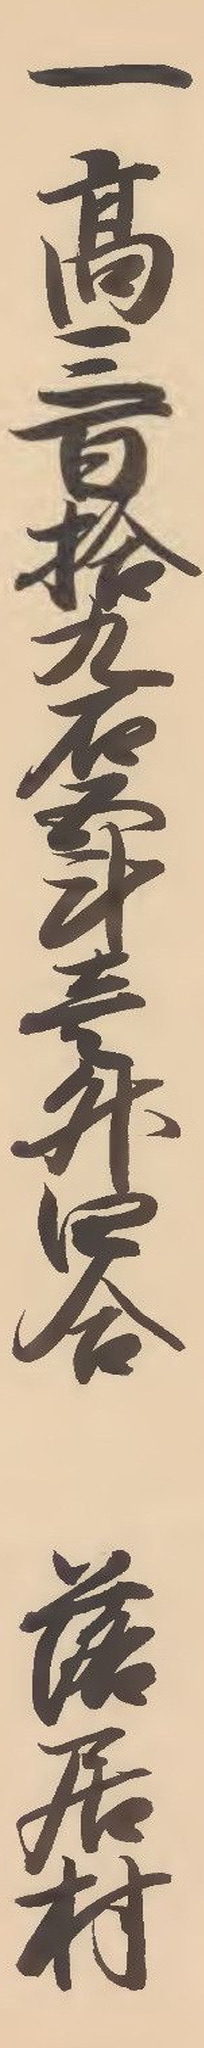一高三百拾九石五斗壱升四合落居村
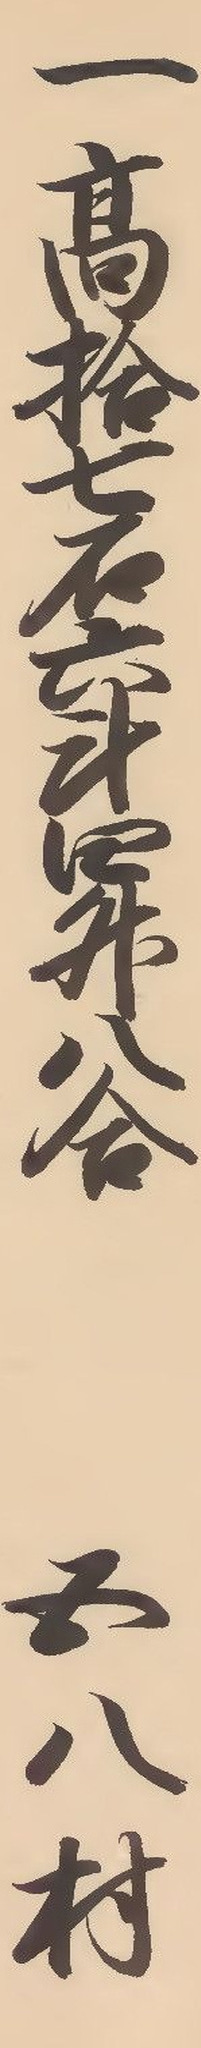一高拾七石六斗四升八合五八村
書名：甲斐国郷帳
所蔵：国立公文書館 National Archives of Japan
